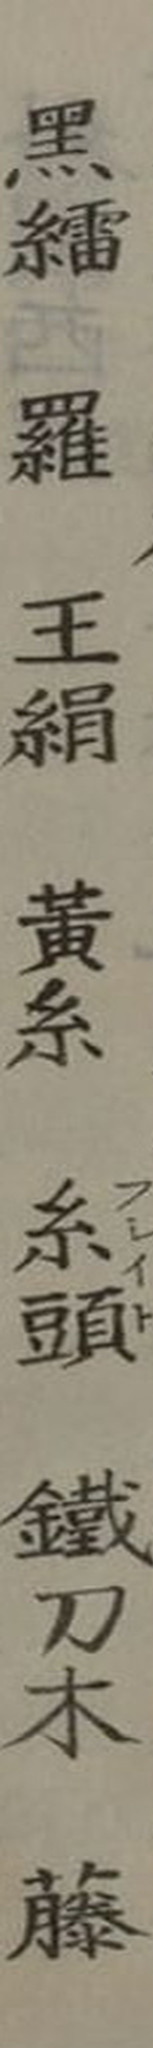黒糖羅王絹黄糸糸頭鐵刀木藤
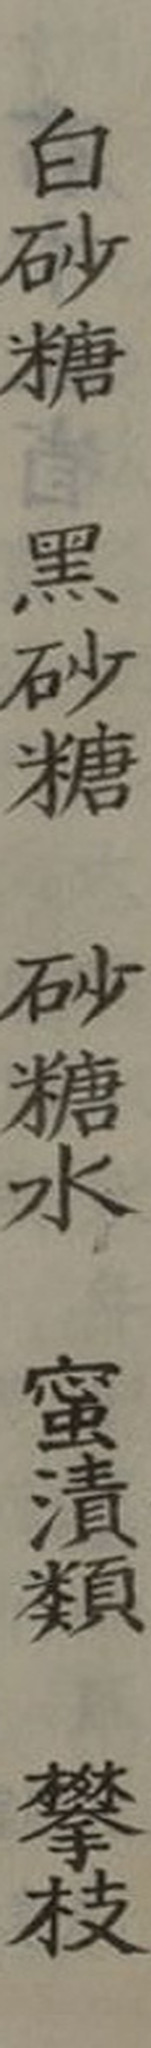白砂糖黑砂糖砂糖水蜜漬類攀枝
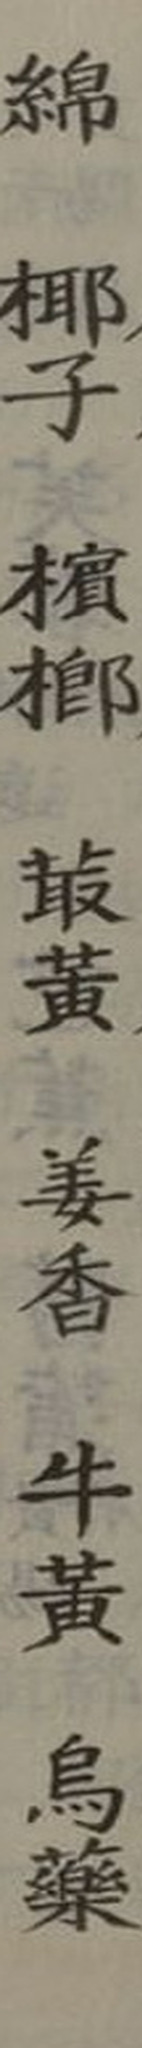綿椰子㯽榔菆黄姜香牛黄烏藥
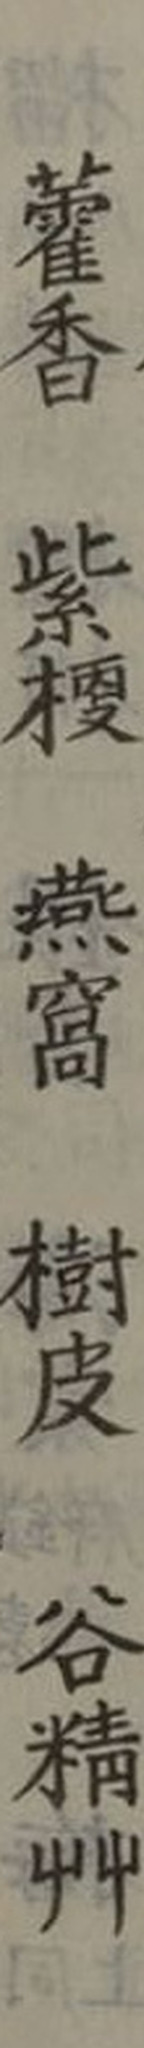藿香紫燕窩樹皮谷精艸
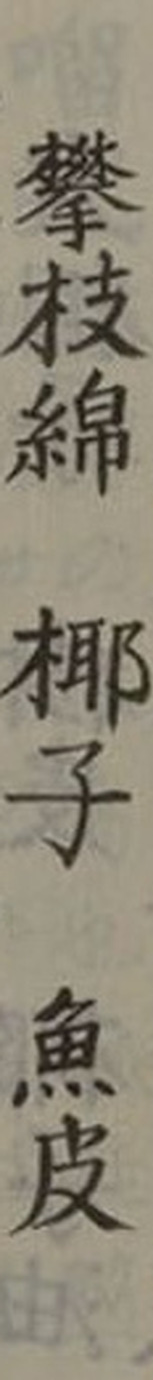攀枝綿椰子魚皮
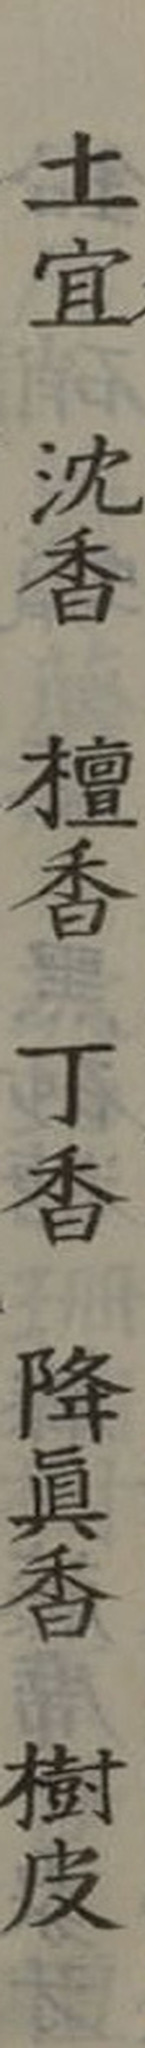土宜沈香檀香丁香降眞香樹皮
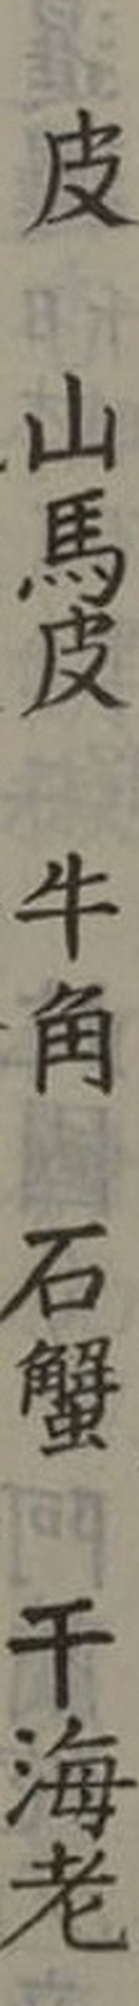皮山馬皮牛角石蟹干海老
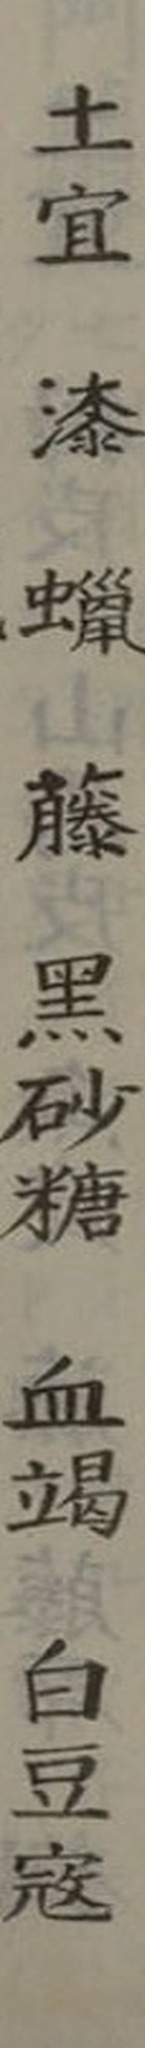土宜漆臘藤黑砂糖血竭白豆寇
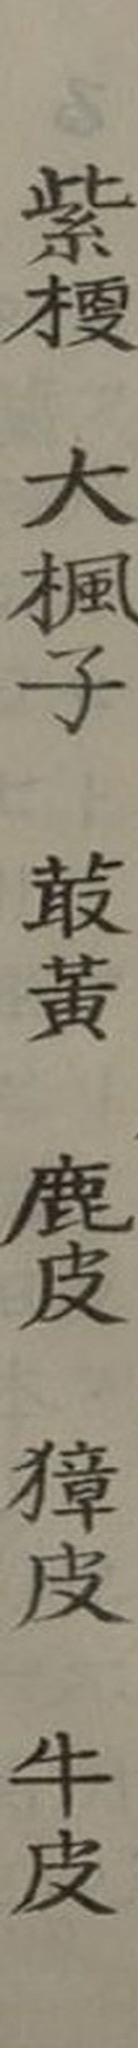紫大楓子菆黄鹿皮獐皮牛皮
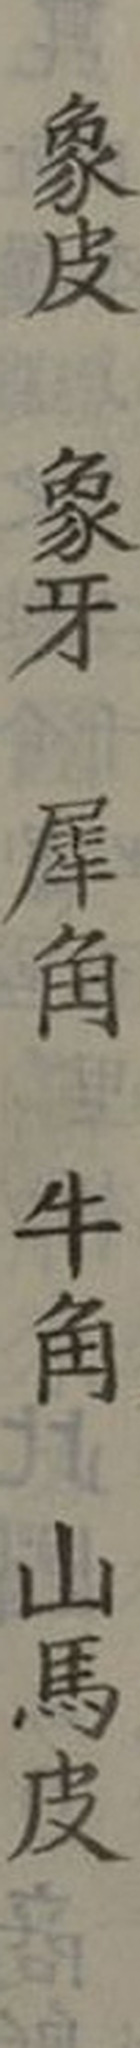象皮象牙犀角牛角山馬皮

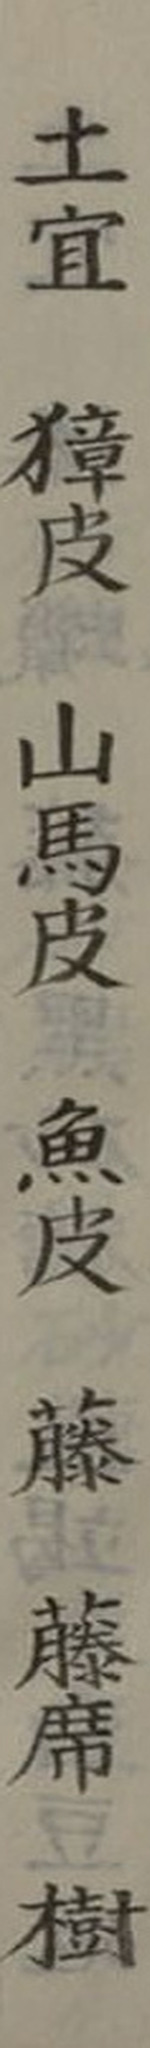土宜獐皮山馬皮魚皮藤藤席樹
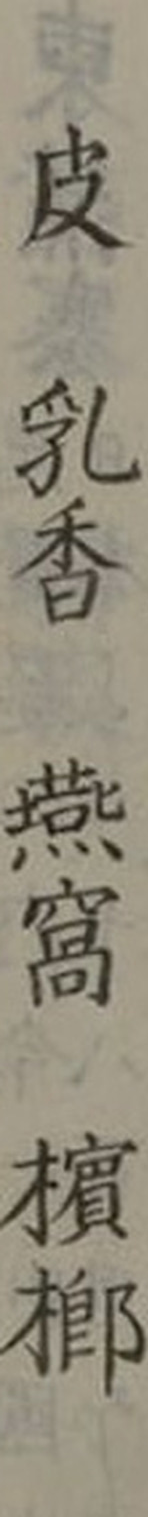皮乳香燕窩㯽榔
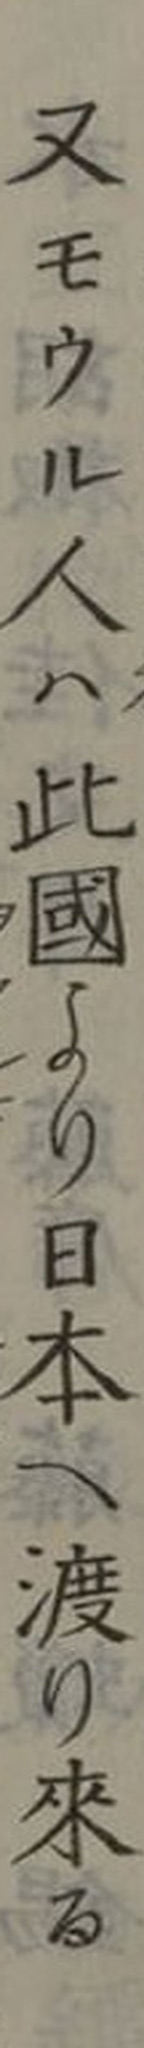又モウル人は此國より日本へ渡り來る
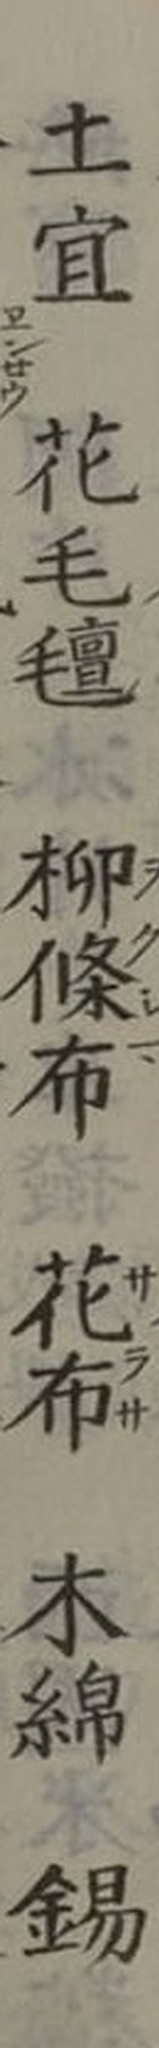土宜花毛氈柳條布花布木綿錫
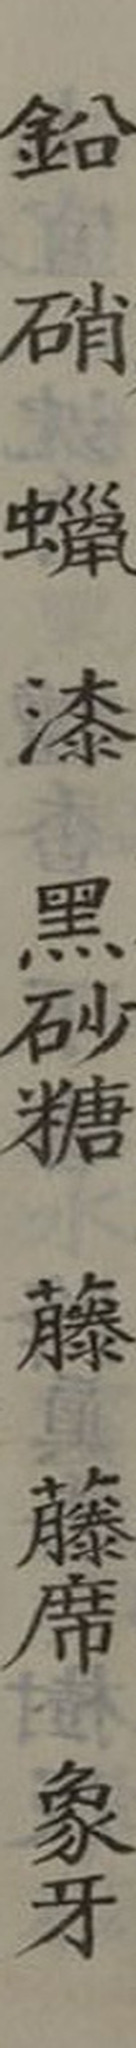鉛硝蠟漆黑砂糖藤藤席象牙
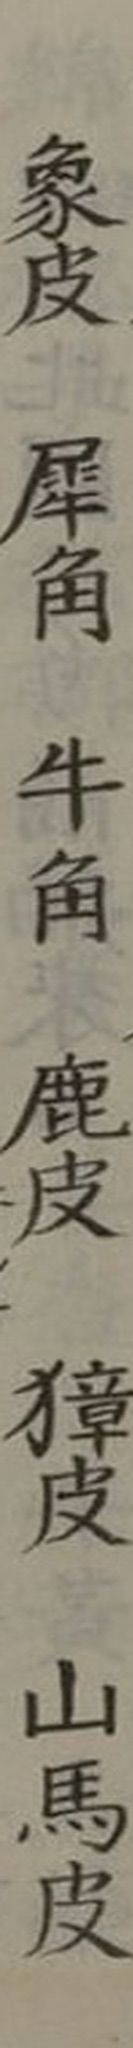象皮犀角牛角鹿皮獐皮山馬皮
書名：骨董録
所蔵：University of the Ryukyus Library
